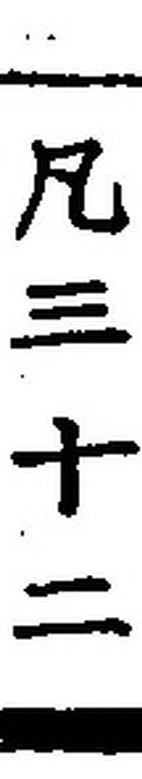凡三十二
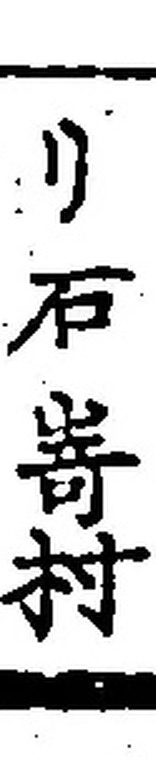リ石崎村
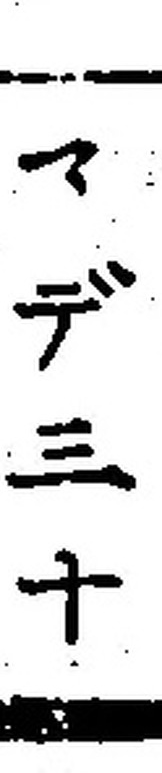マデ三十
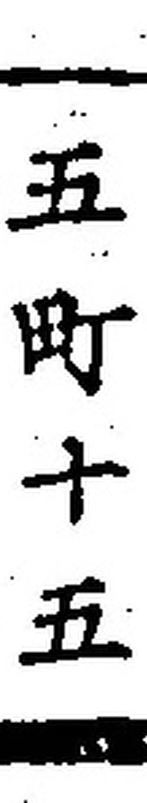五町十五
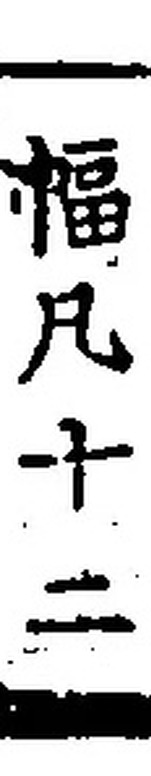幅凡十二
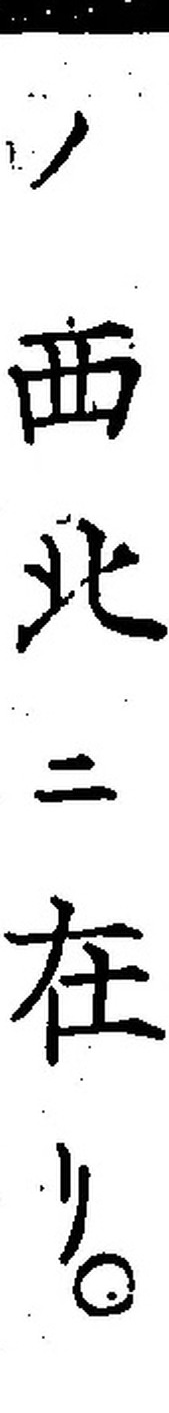ノ西北ニ在リ。
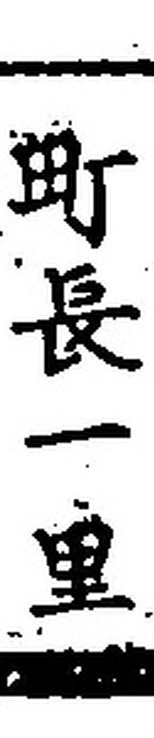町長一里
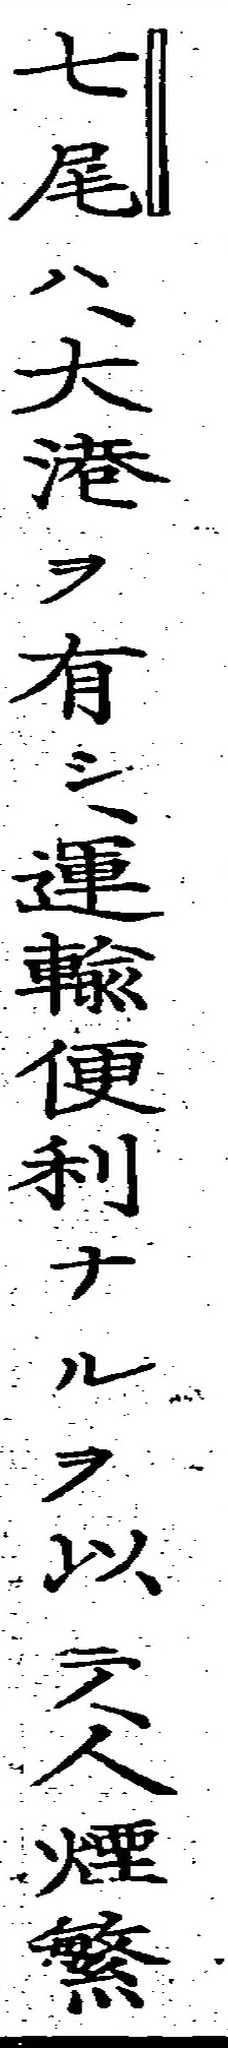七尾ハ、大港ヲ有シ、運輸便利ナルヲ以テ、人煙繁
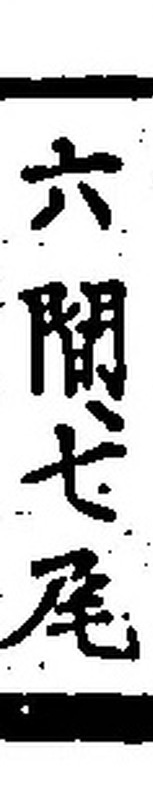六間、七尾
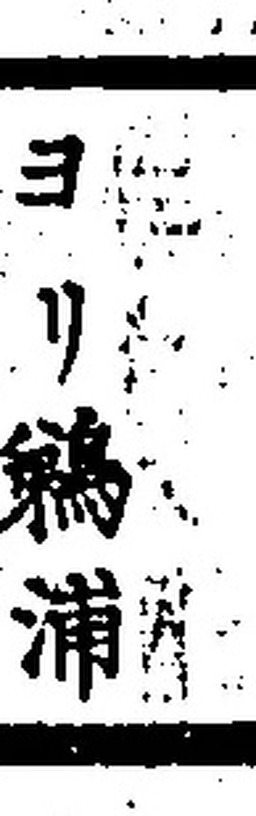ヨリ鵜浦
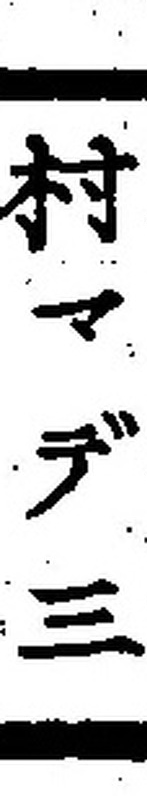村マデ三
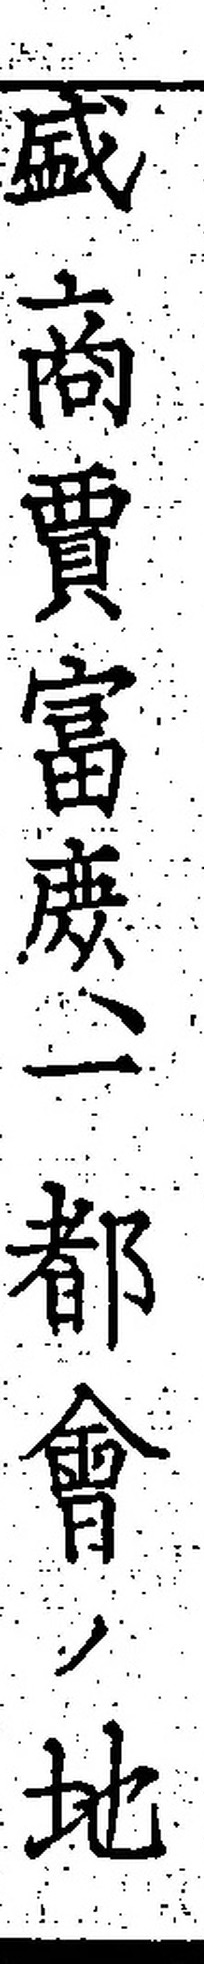盛商賈富庶、一都会ノ地
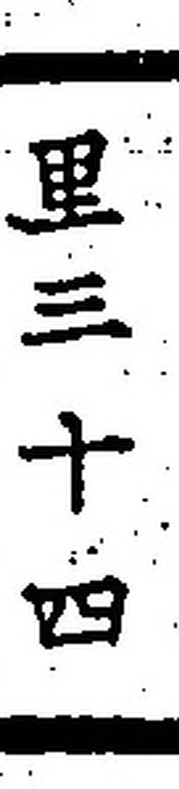里三十四
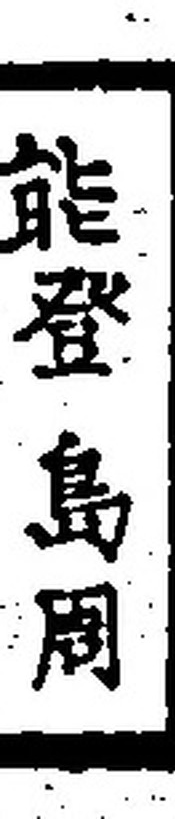能登島周
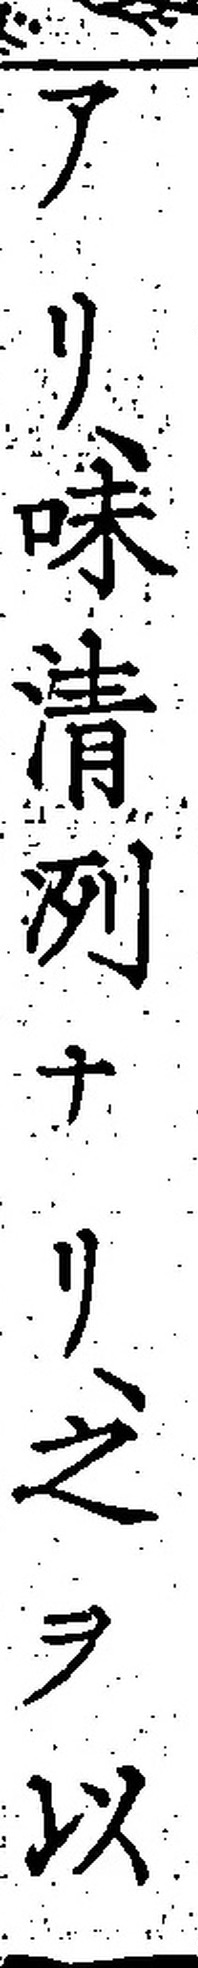アリ、味清冽ナリ、之ヲ以
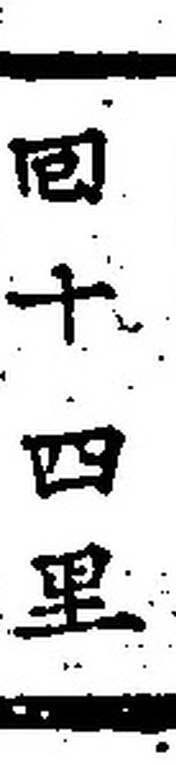回十四里
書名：能登地誌略
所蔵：国立国会図書館 National Diet Library, JAPAN
